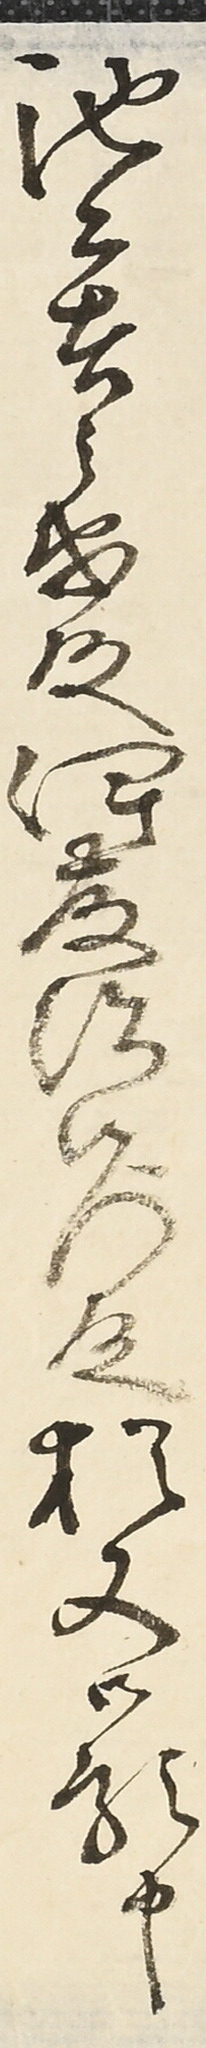池上吉兵衛殿伊藤治右衛門殿猶又御願申
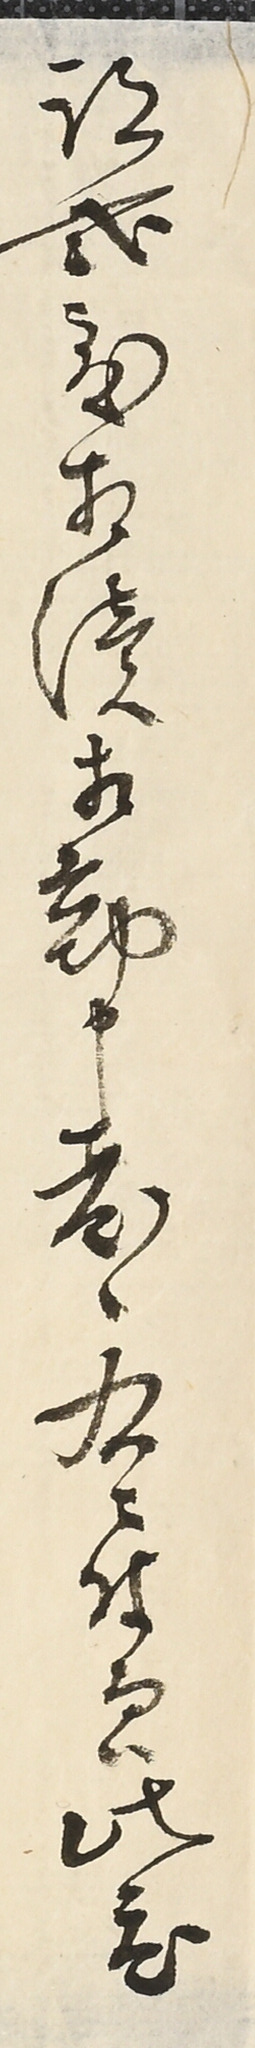跡式致相続相勤申度候右ニ付而ハ此度
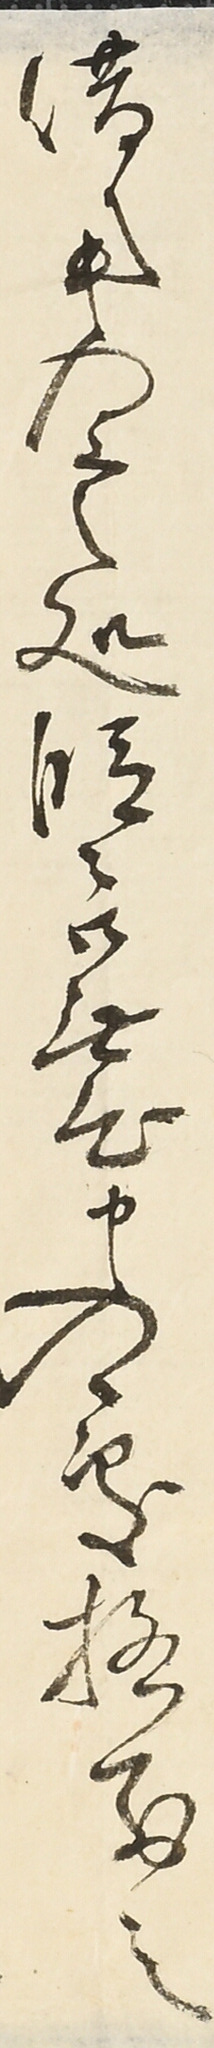借用金之処段々御無心申入候処格別之
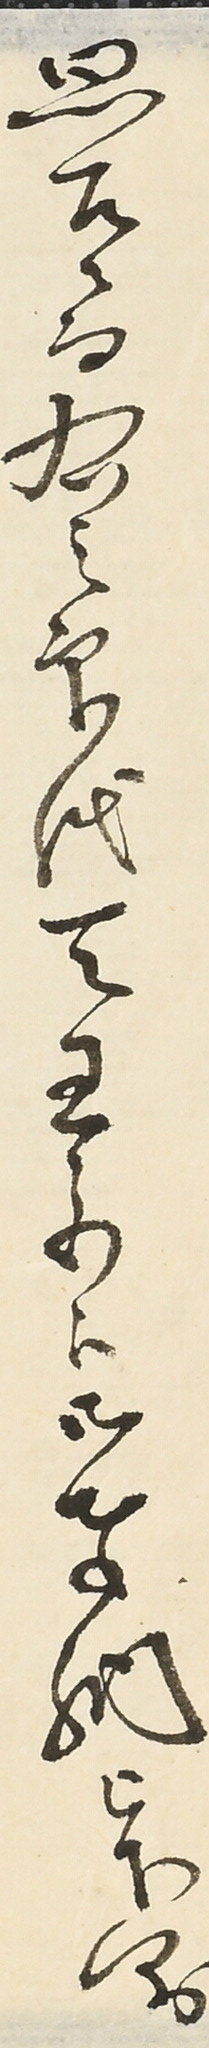思召ニ而右之印紙天王宮江御奉納被下則
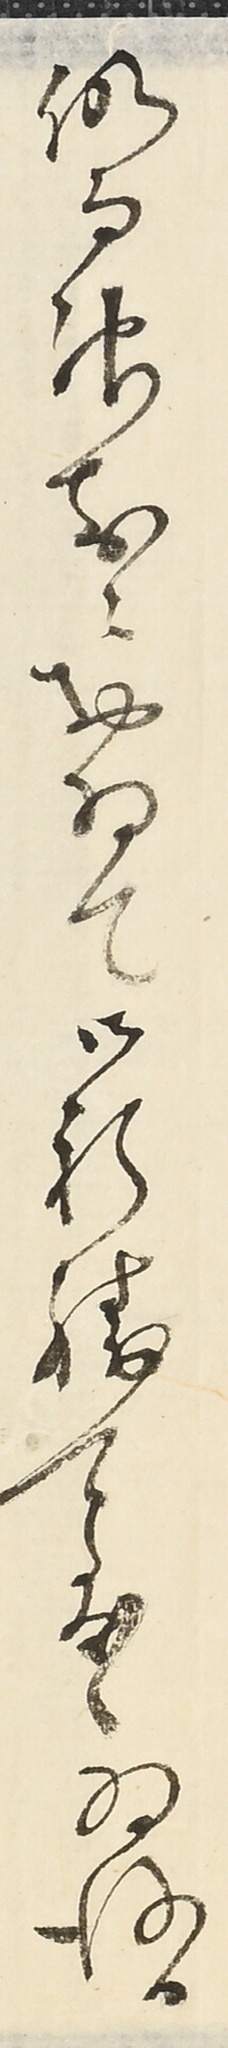仍而神前ニおゐて御祈祷可致候為後日
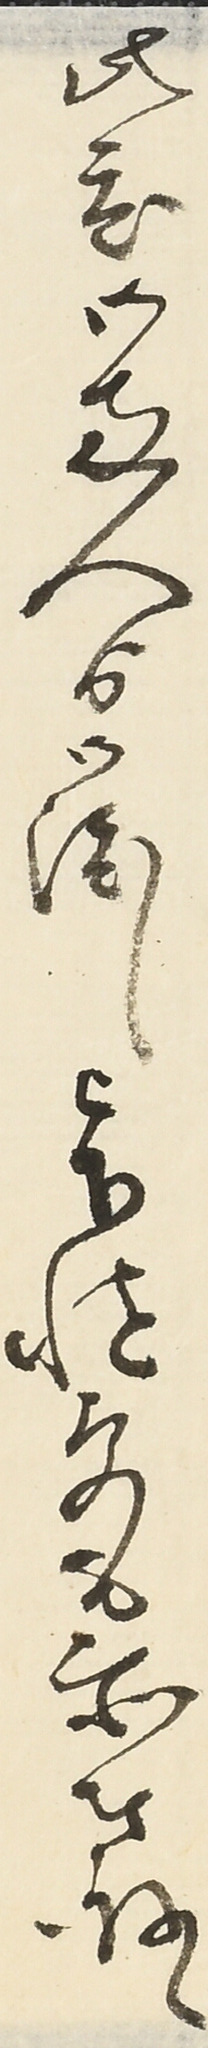此度御両人ゟ御渡し被下慥受取忝奉存候
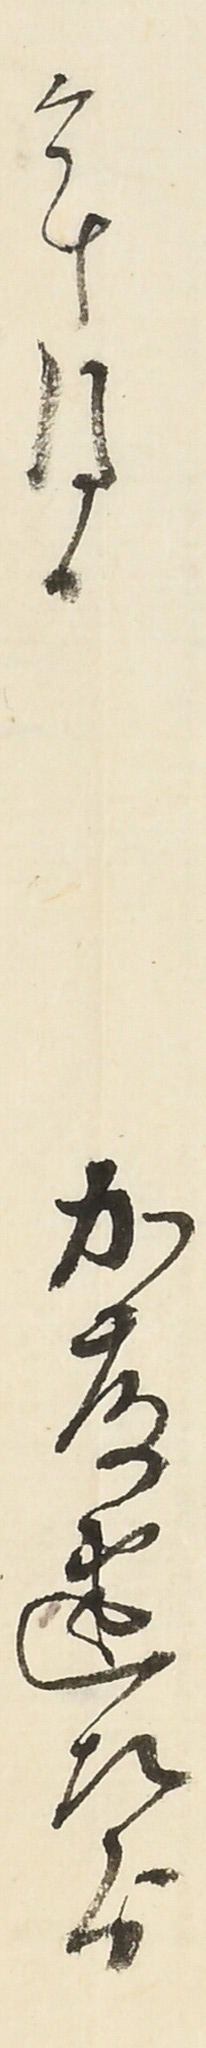午十月日加藤健左衛門
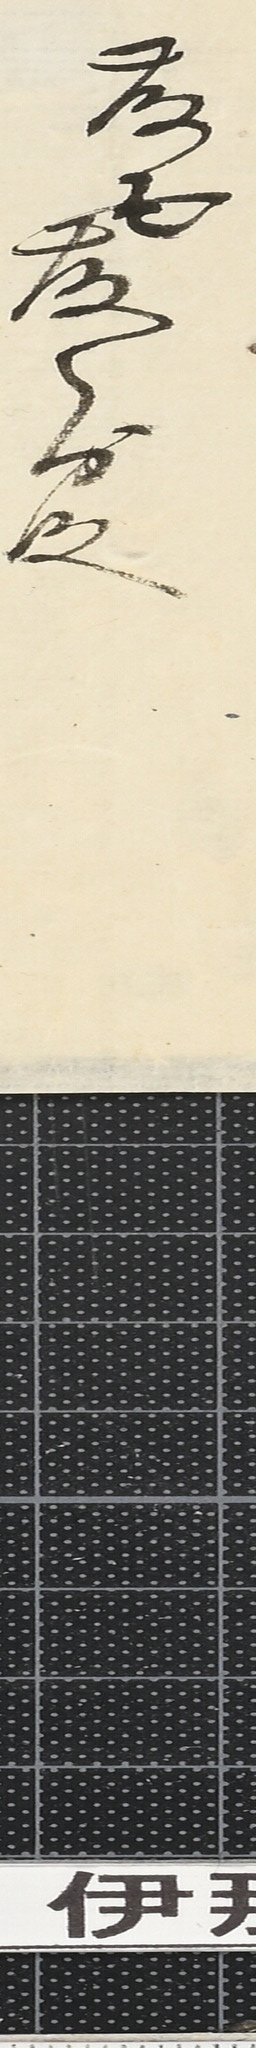藤屋藤右衛門殿

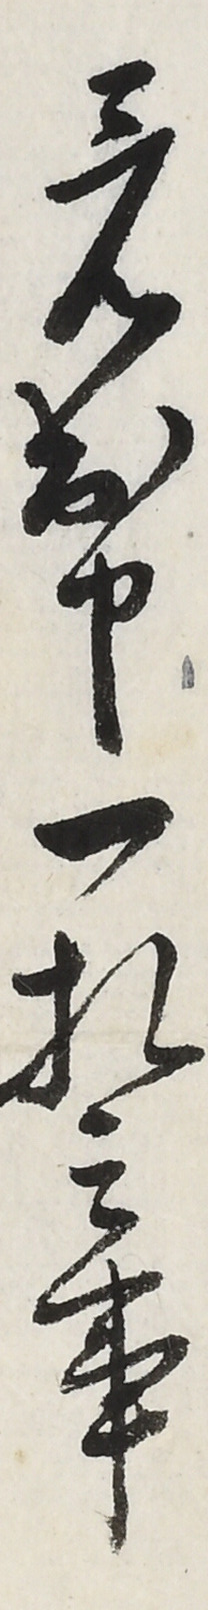差出申一札之事
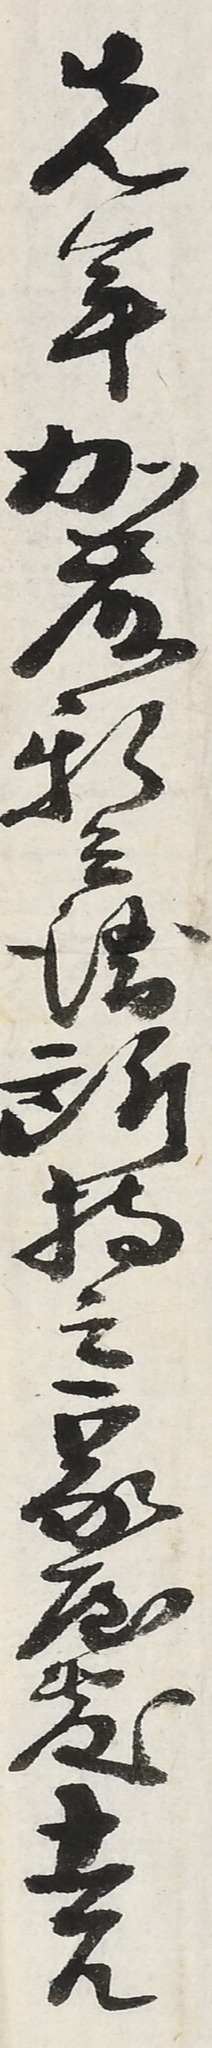先年加藤新兵衛所持之家屋敷去ル
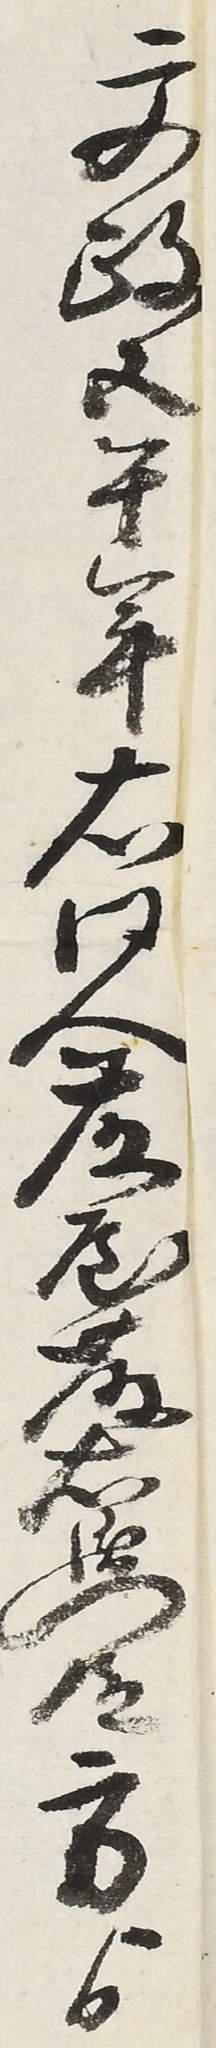文政五午年右同人藤屋藤右衛門殿方ゟ
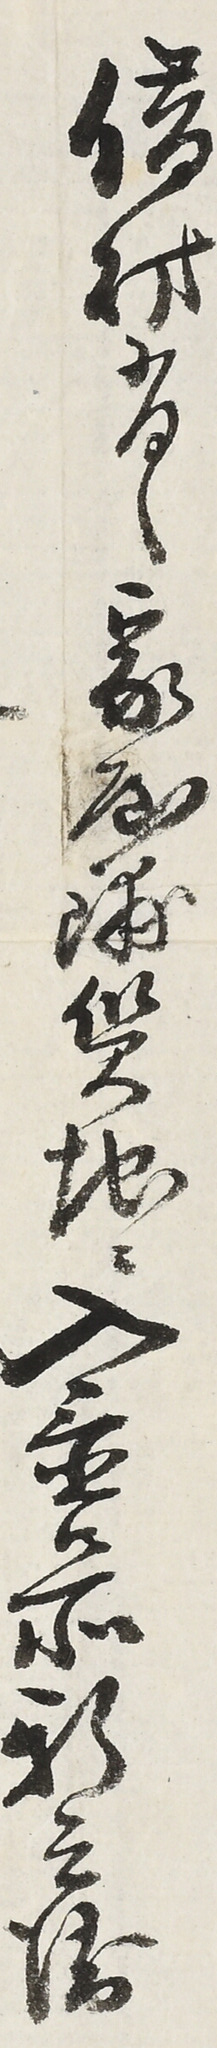借財有之家屋鋪質地ニ入置候所新兵衛
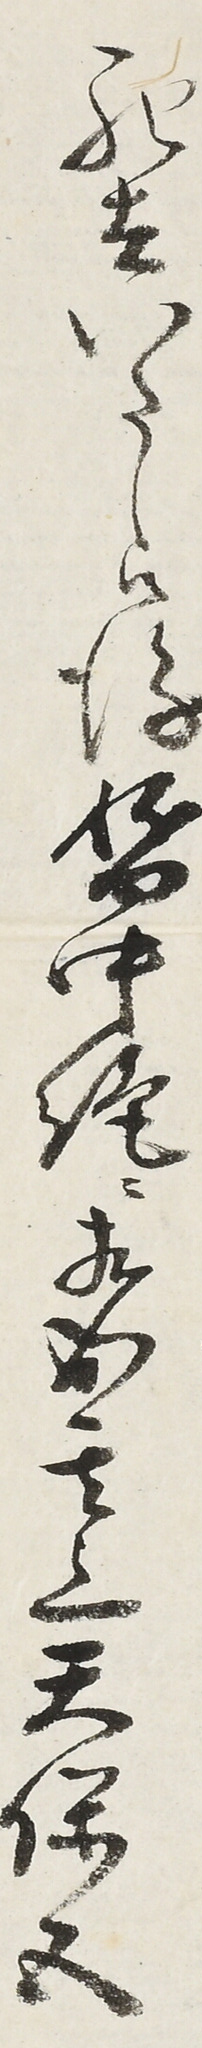死去いたし候後暫中絶ニ相成其上天保五
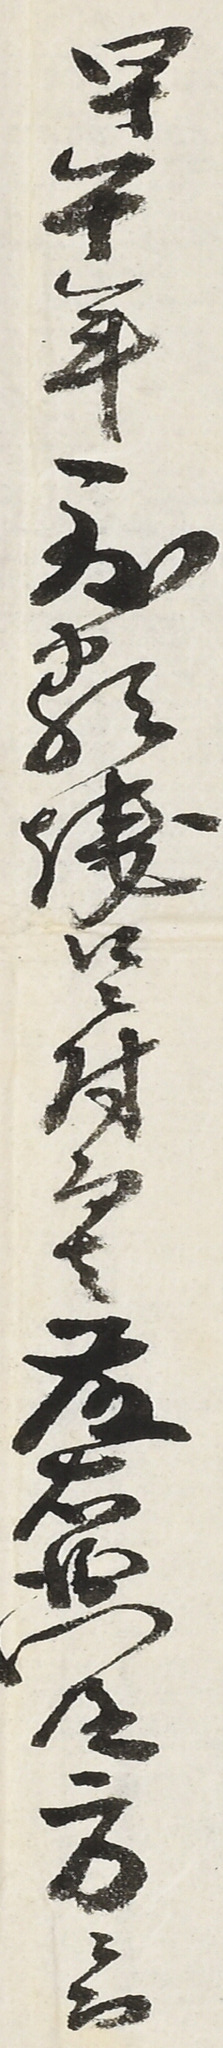甲午年致類焼候ニ付而者藤右衛門方ニ而
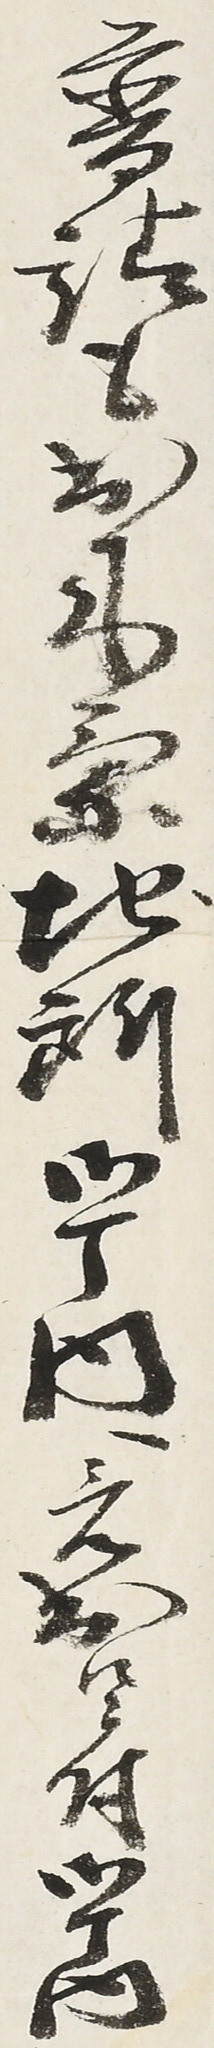普請も出来兼地所御丁内へ差出候ニ付御丁内
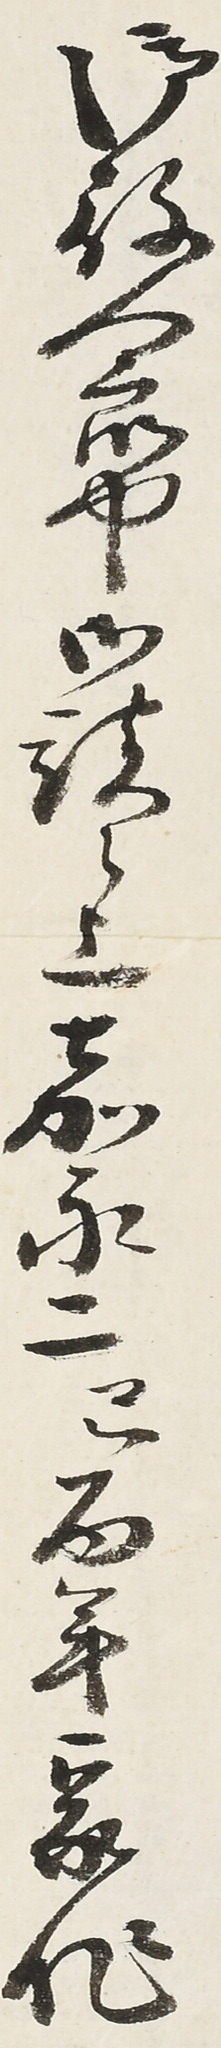御役人衆中御談之上嘉永二己酉年家作
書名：差出申一札之事
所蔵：伊那市立高遠町図書館・合同会社AMANE
